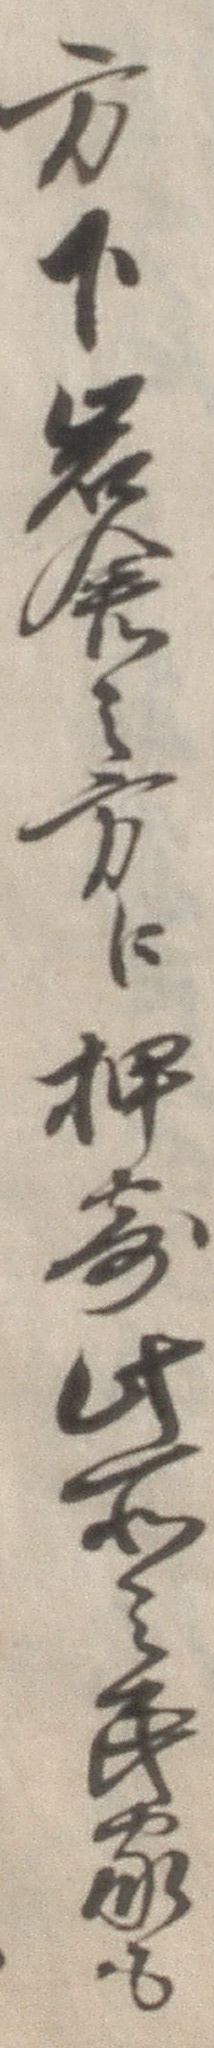方下岩倉之方江押寄此所之民家も
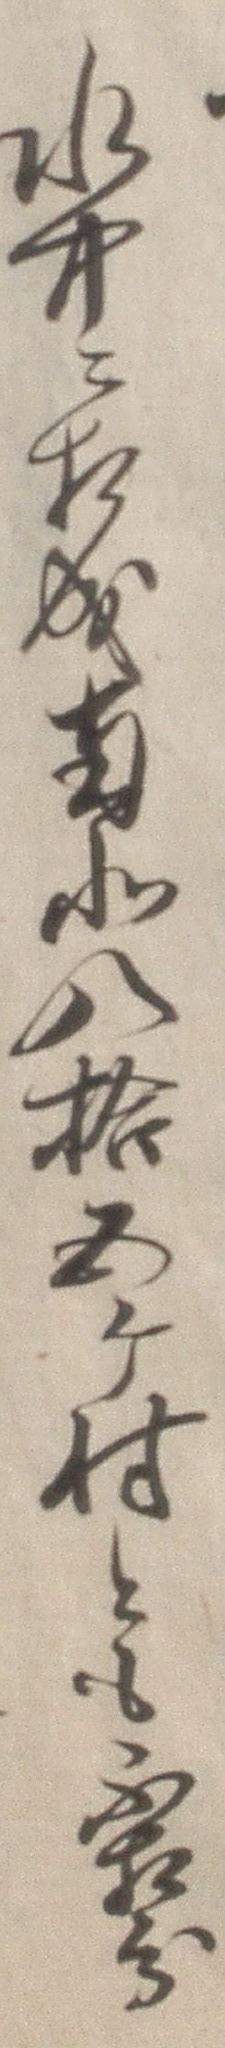水中二相成南北八拾五ヶ村とも不相分
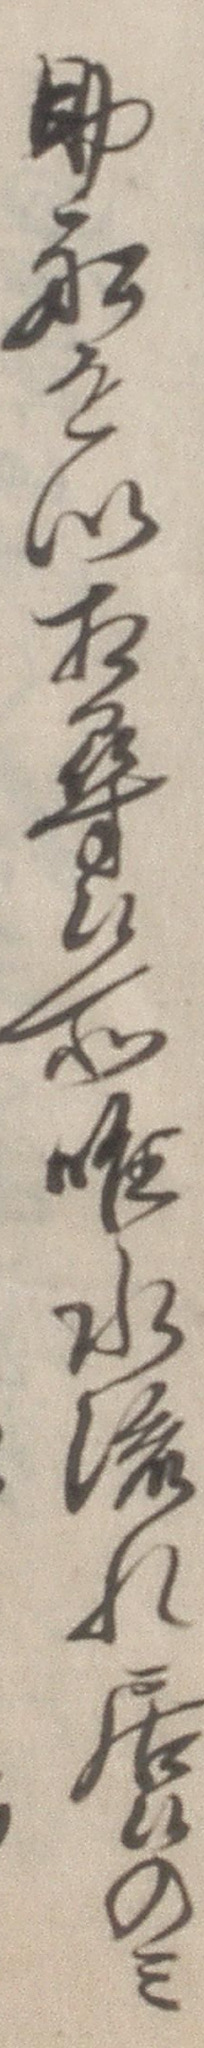助船を以相尋候所唯水流れ居候のミ
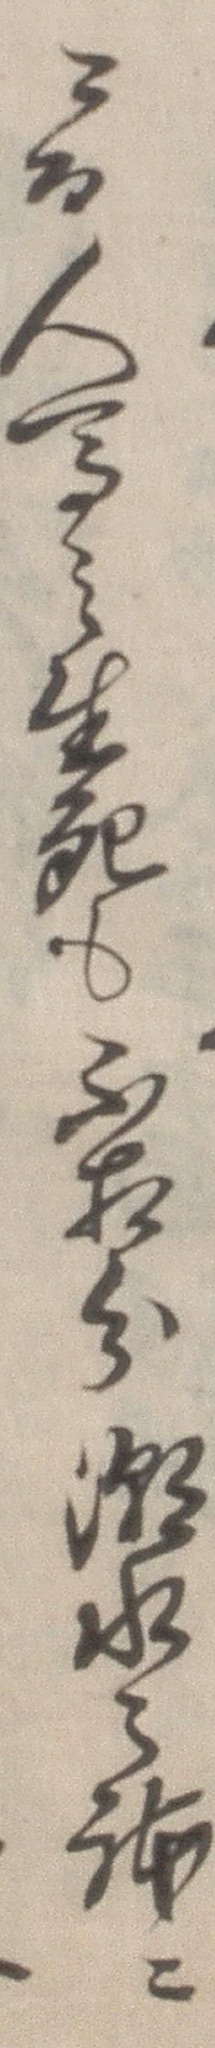二而人馬之生死も不相分激水之体二
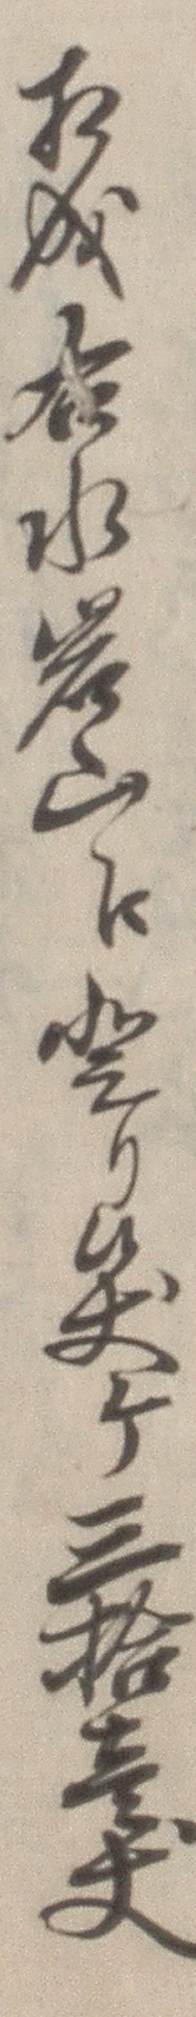相成右水岩山江登候丈ヶ参拾壱丈
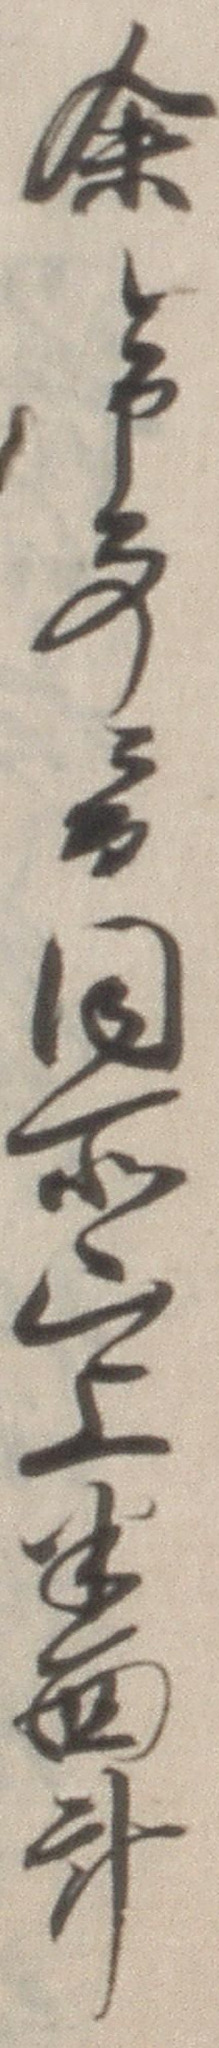余と申事二而同所山上半面計
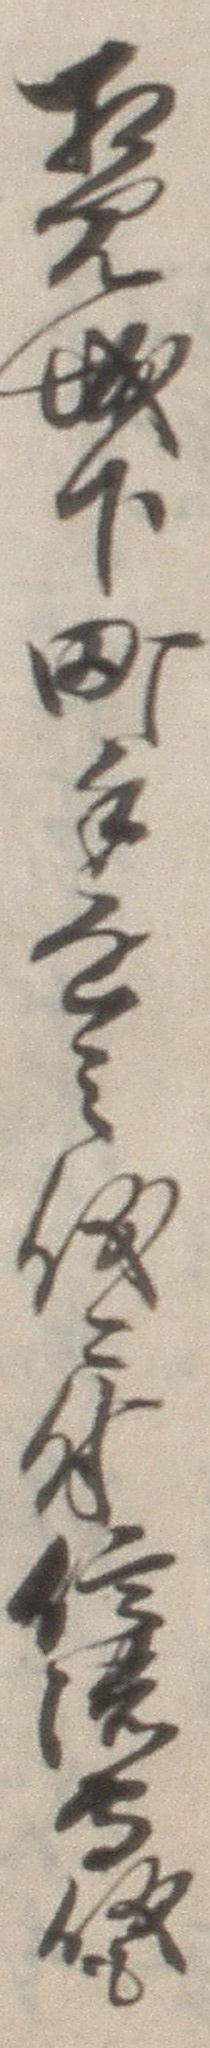相見城下町手近の儀二付信濃守儀も
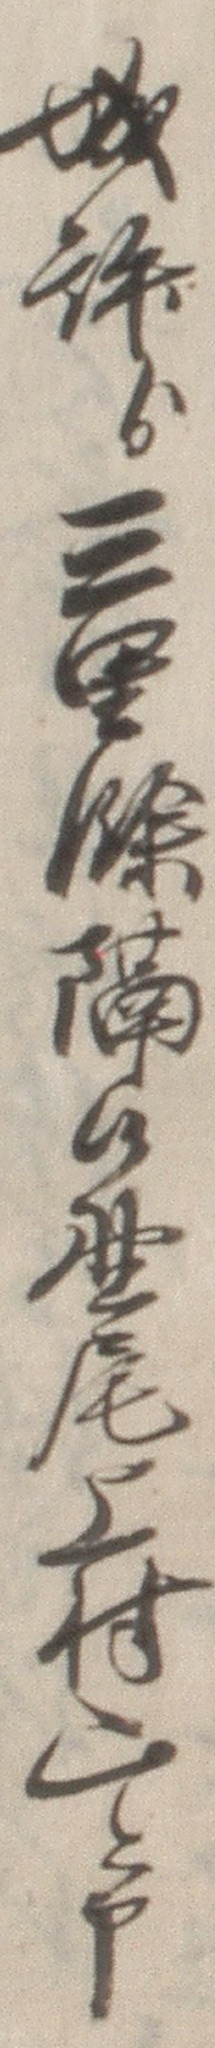城許ゟ三里餘隔候曲尾上村山と申
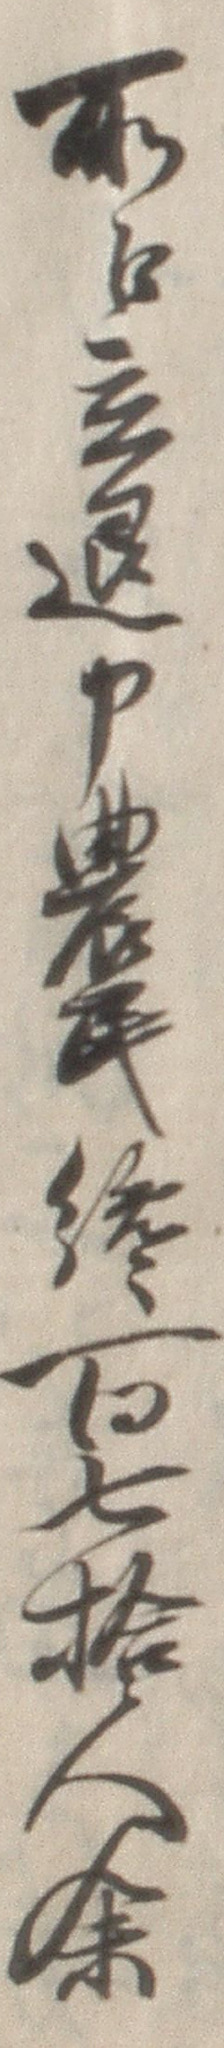所江立退申農民纔百七拾人余
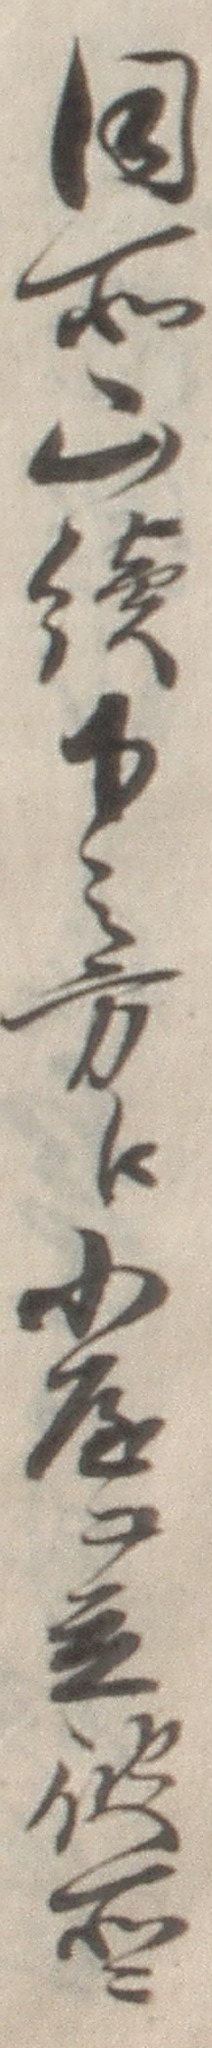同所山続下之方江小屋ヲ立彼所二
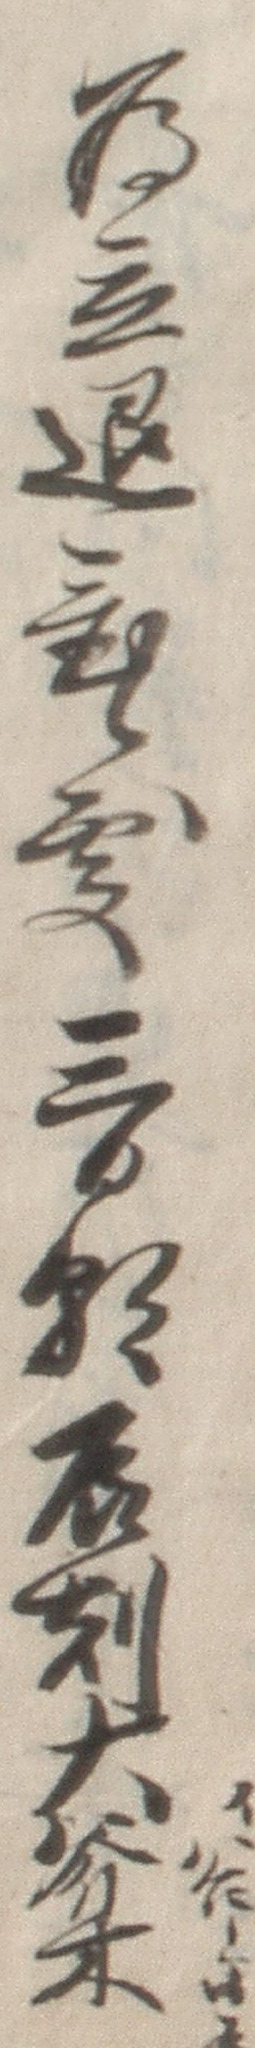為立退置候処三日朝辰刻大谷木
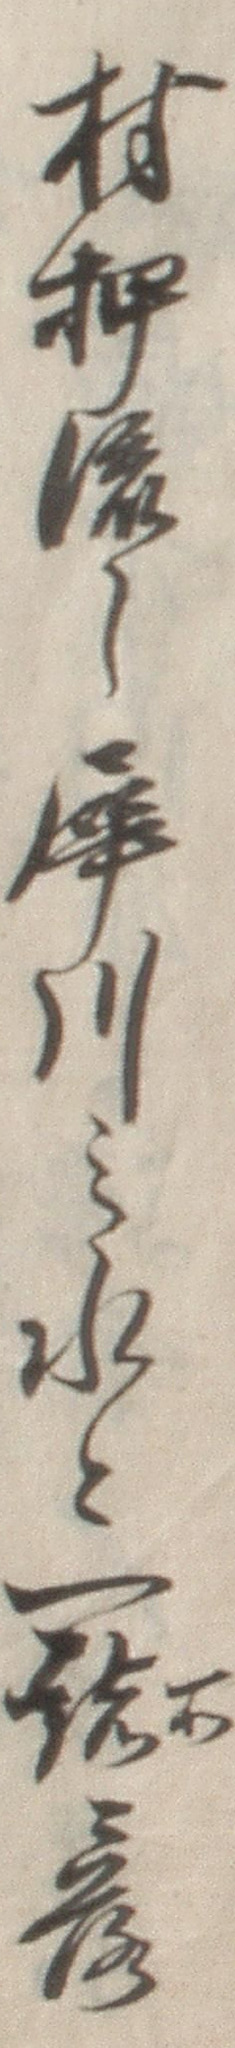村押流し犀川之水と一所二落
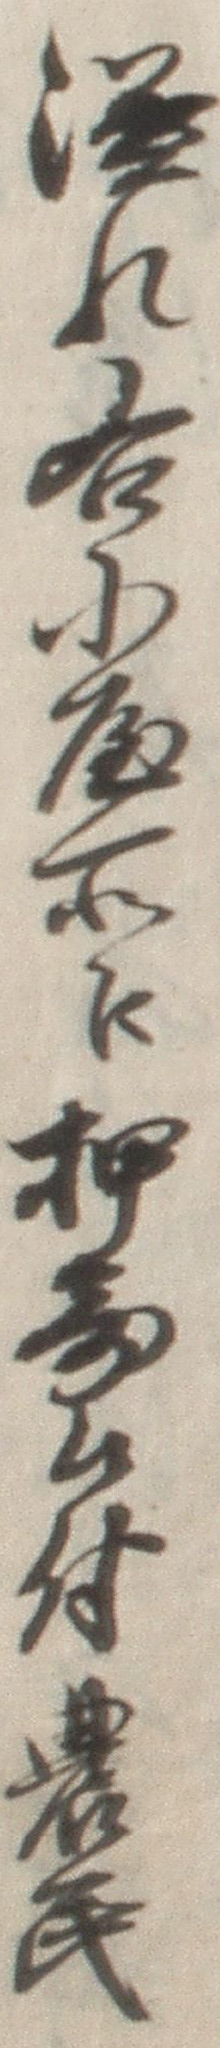溢れ右小屋所江押寄候付農民
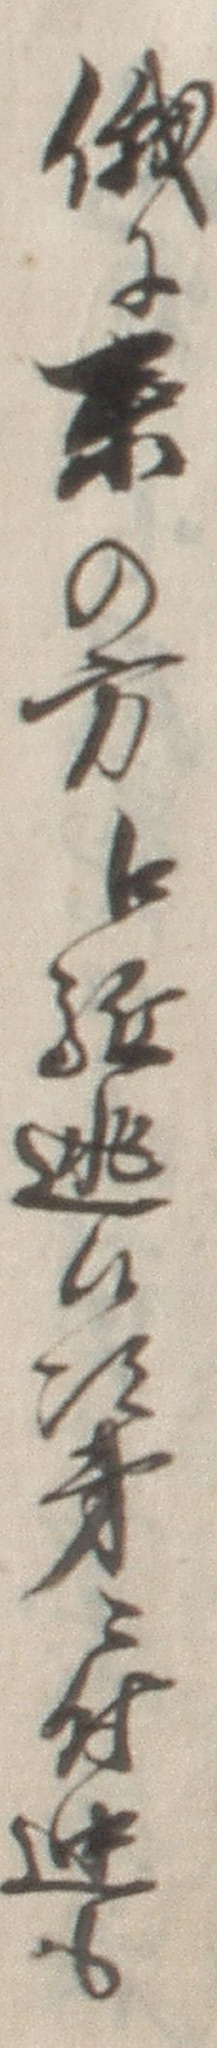俄に東の方江駆逃候次第二付迚も

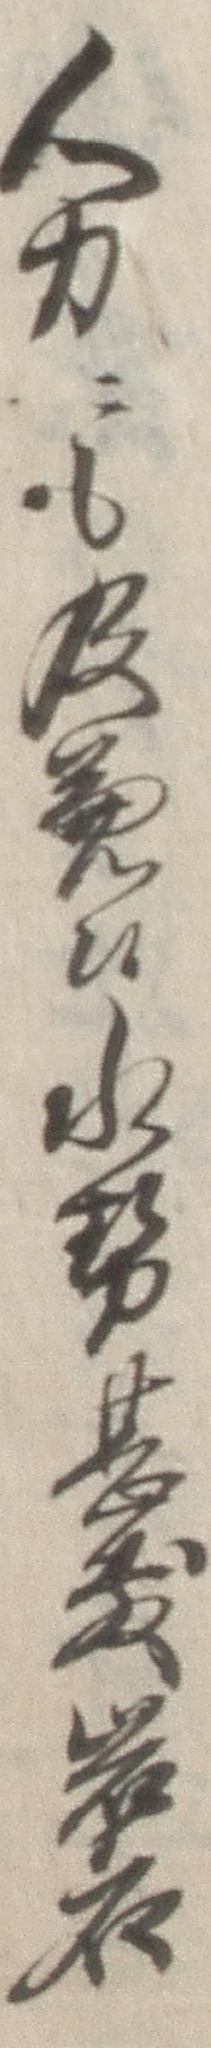人力二も及兼候水勢甚敷岩石
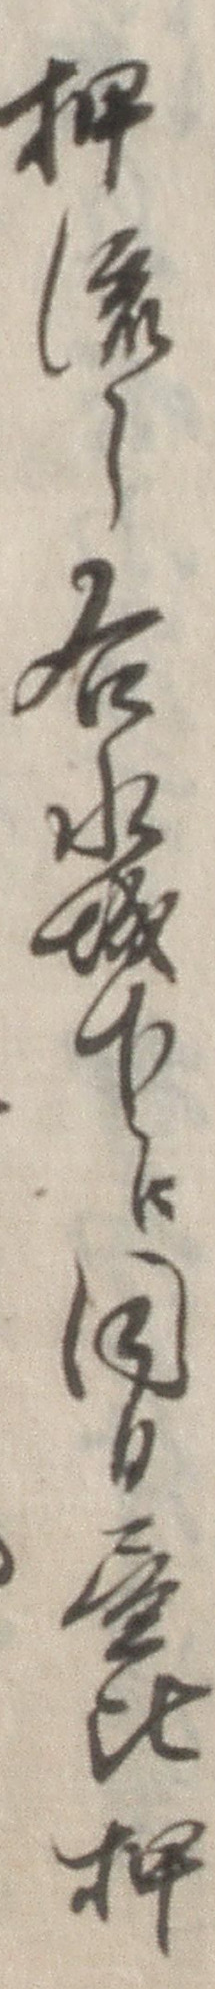押流し右水城下江同日昼比押
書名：信州地震一件
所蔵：東京大学地震研究所図書室 Earthquake Research Institute Library, The University of Tokyo, JAPAN
